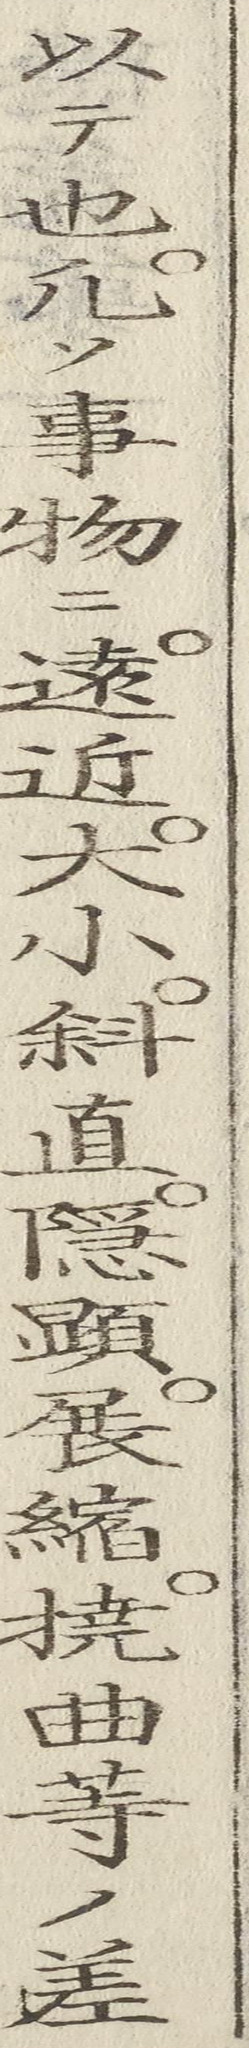以テ也。凡ソ事物ニ。遠近。大小。斜直。隠顕。展縮。撓曲等ノ差
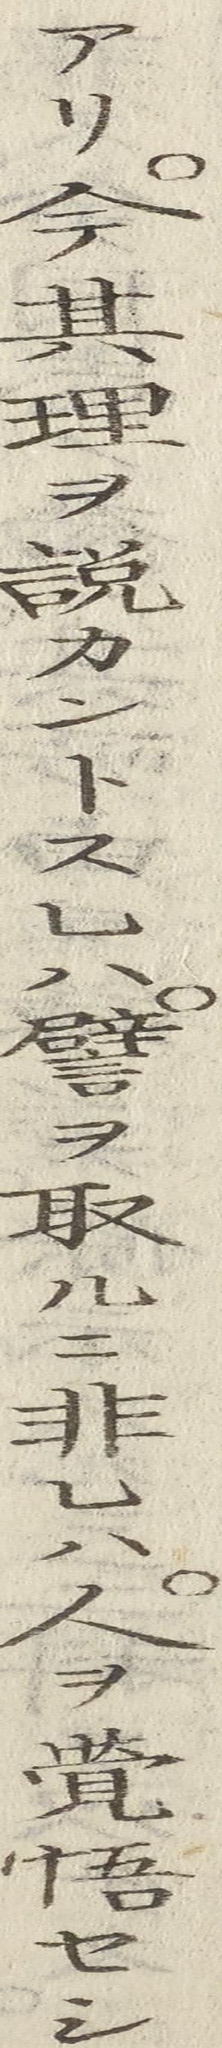アリ。今其理ヲ説カントスレハ。譬ヲ取ルニ非レハ。人ヲ覚悟セジ
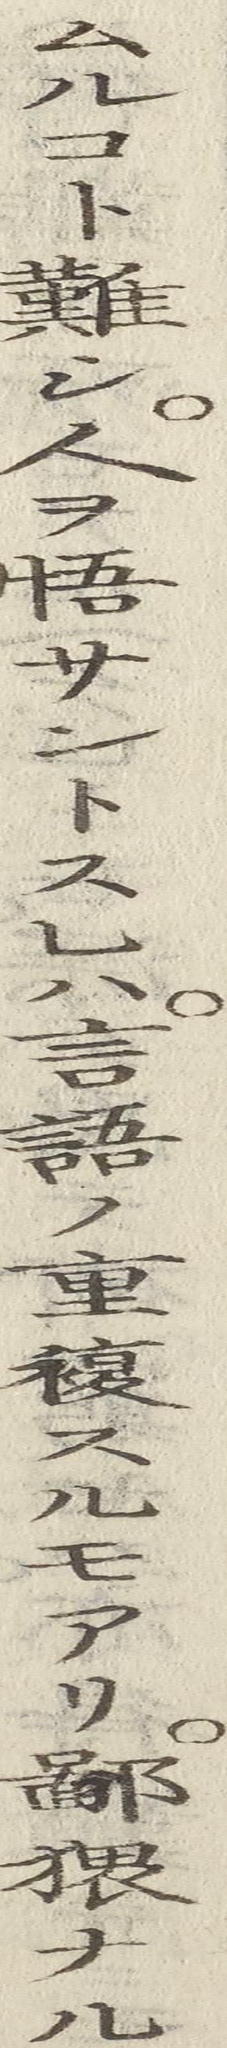ムルコト難シ。人ヲ悟サントスレハ。言語ノ重複スルモアリ。鄙猥ナル
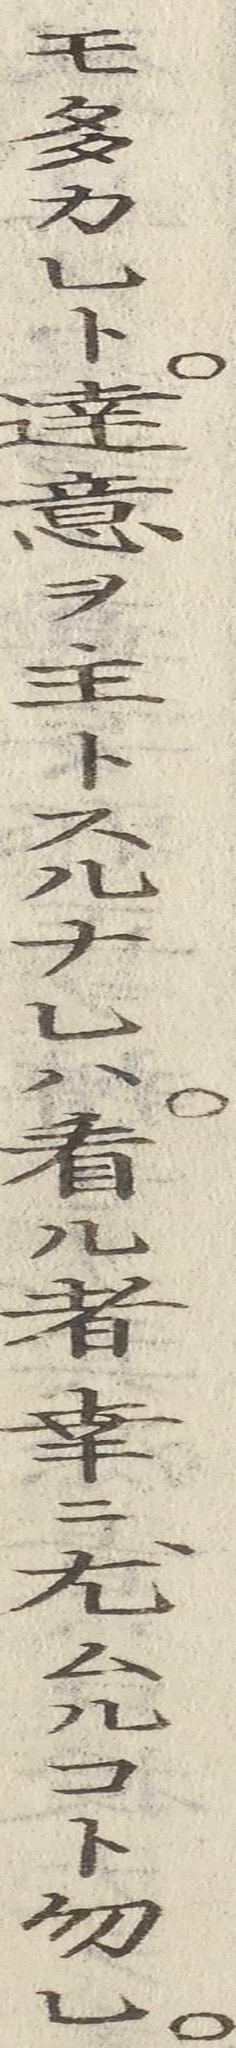モ多カレト。達意ヲ主トスルナレハ。看ル者幸ニ尤ムルコト勿レ。
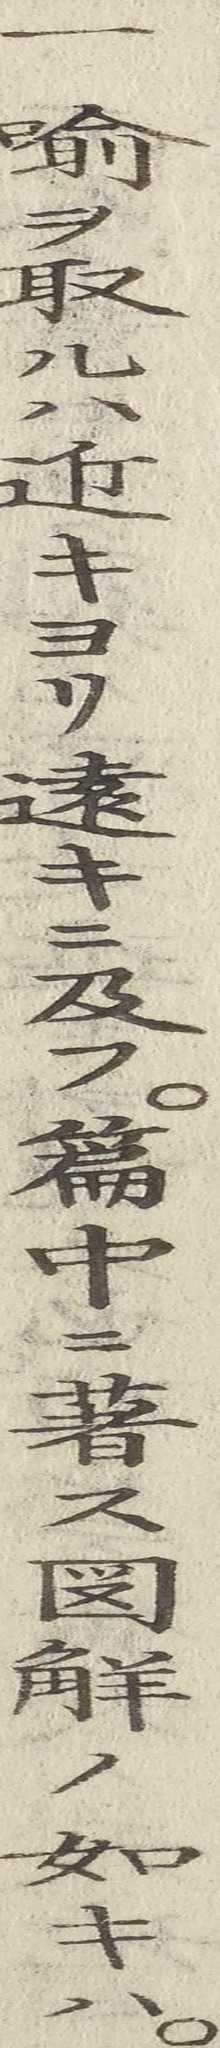一喩ヲ取ルハ近キヨリ遠キニ及フ。篇中ニ著ス図解ノ如キハ。

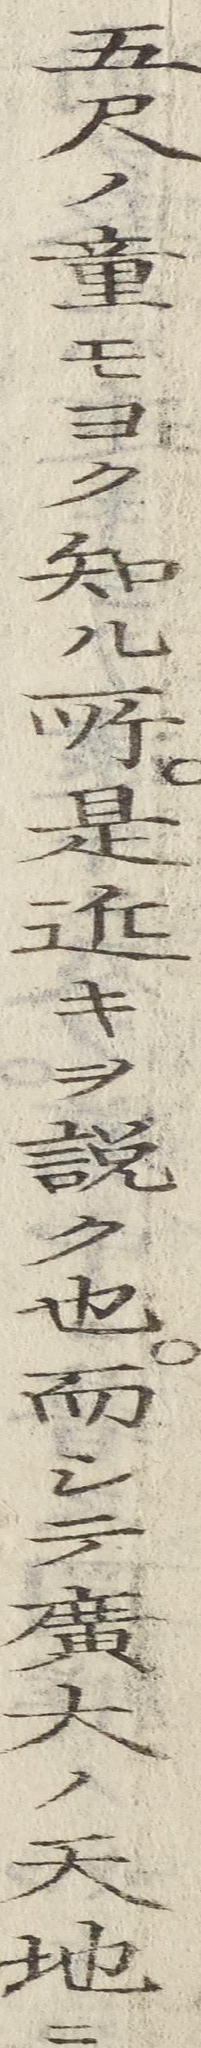五尺ノ童モヨク知ル所。是近キヲ説ク也。而シテ広大ノ天地ニ
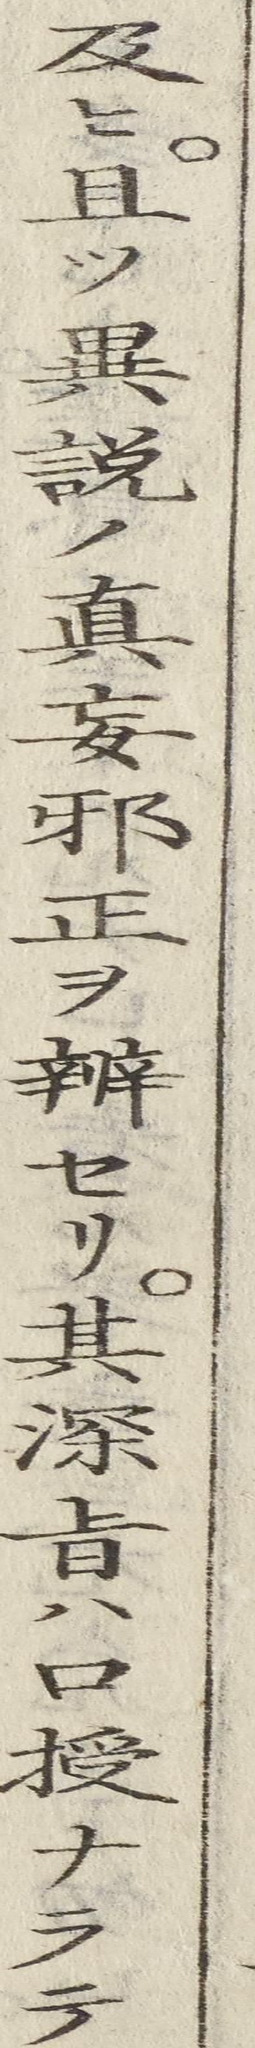及ヒ。且ツ異説ノ真妄邪正ヲ弁セリ。其深旨ハ口授ナラテ
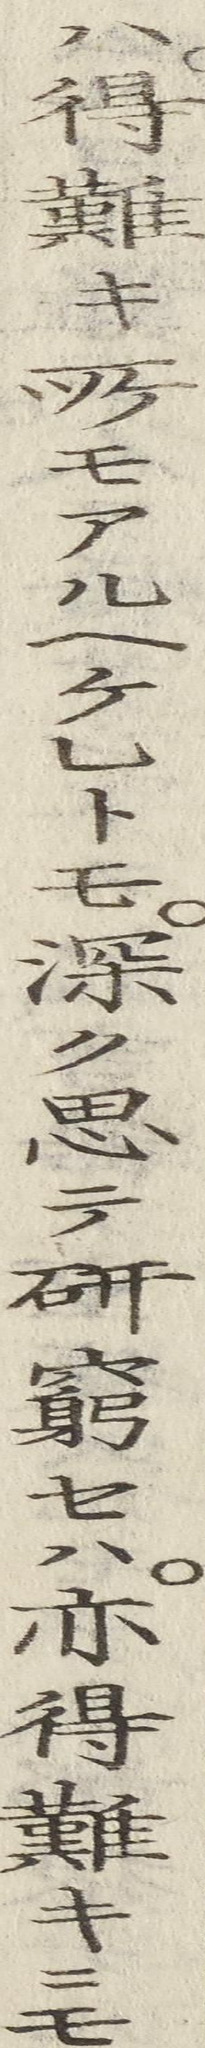ハ。得難キ所モアルヘケレトモ。深ク思テ研窮セハ。亦得難キニモ
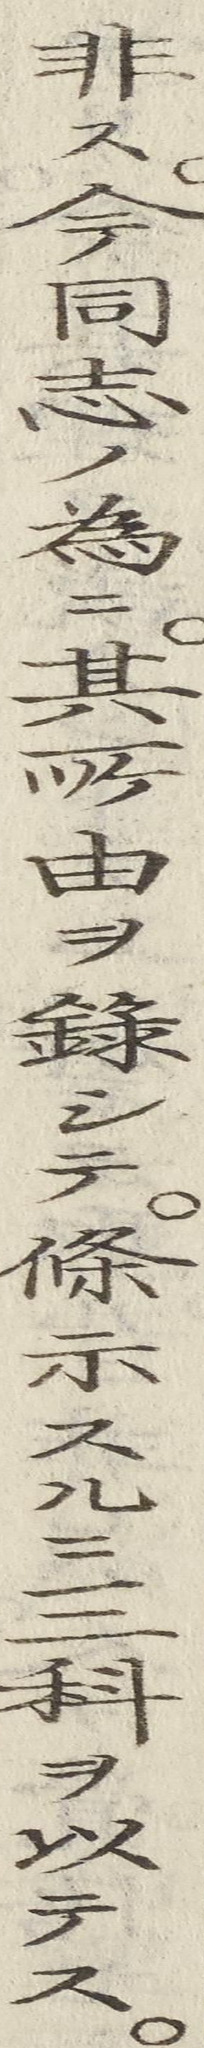非ス。今同志ノ為ニ。其所由ヲ録シテ。条示スルニ三科ヲ以テス。
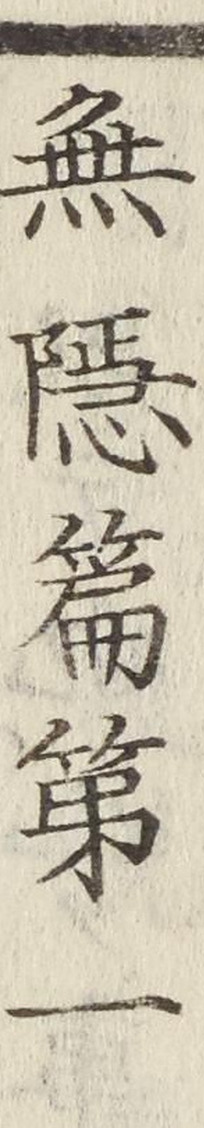無隠篇第一
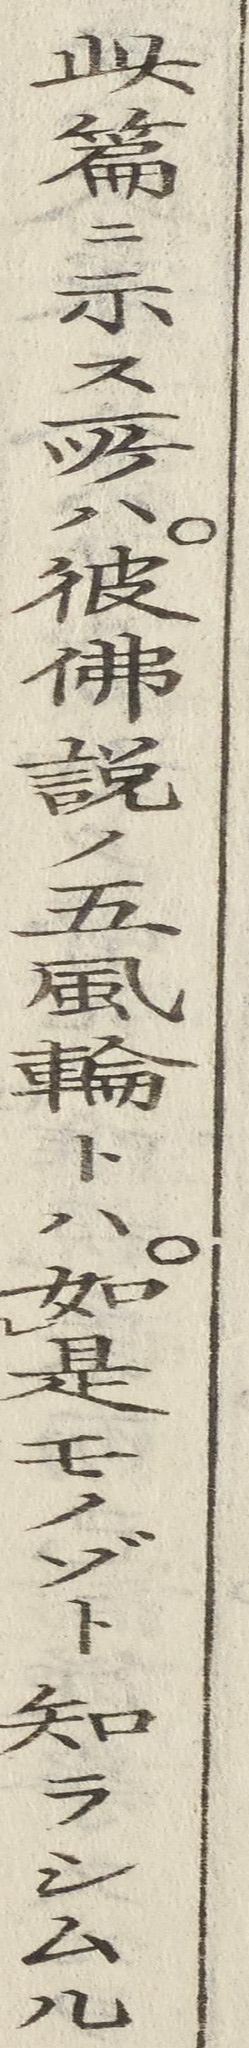此篇ニ示ス所ハ。彼仏説ノ五風論トハ。如是モノゾト知ラシムル
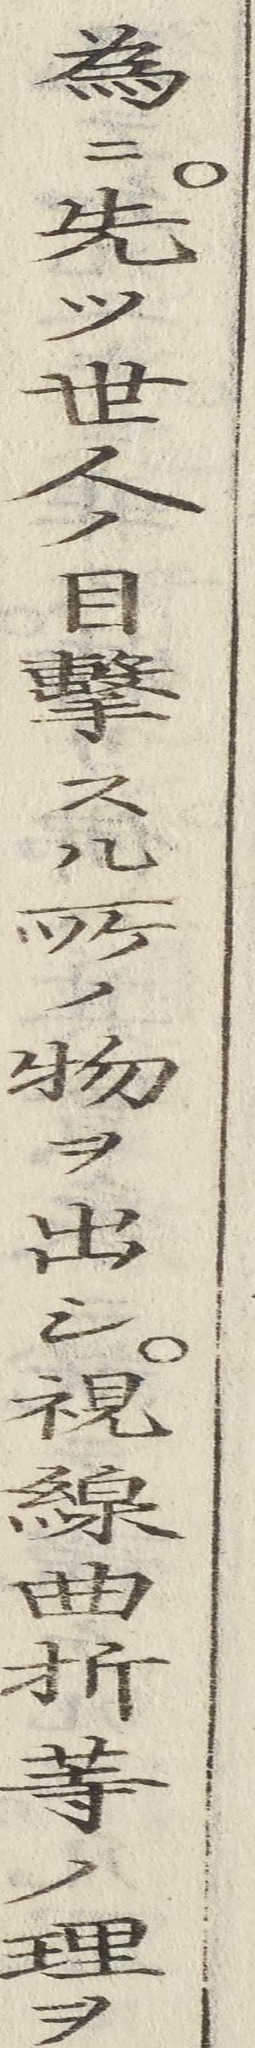為ニ。先ツ世人ノ目撃スル所ノ物ヲ出シ。視線曲折等ノ理ヲ
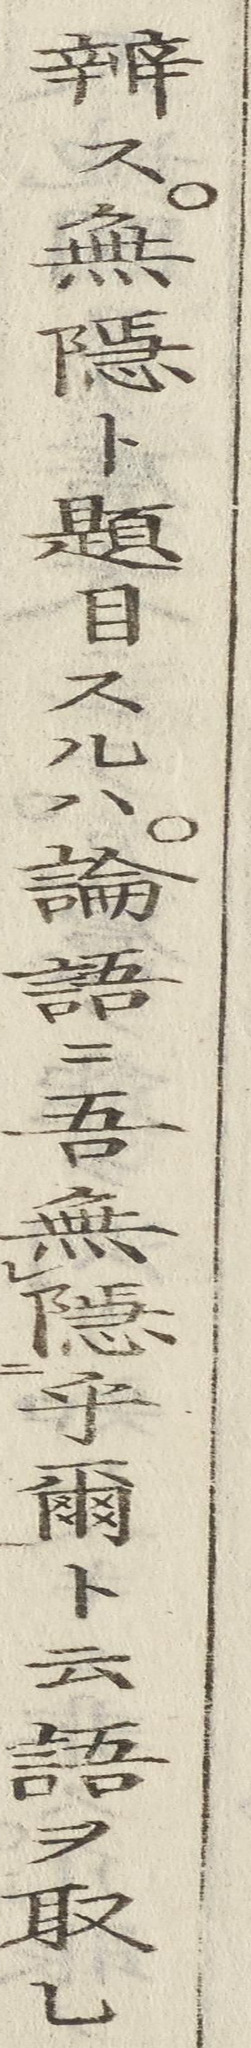弁ス。無隠ト題目スルハ。論語ニ吾無隠乎爾ト云語ヲ取レ
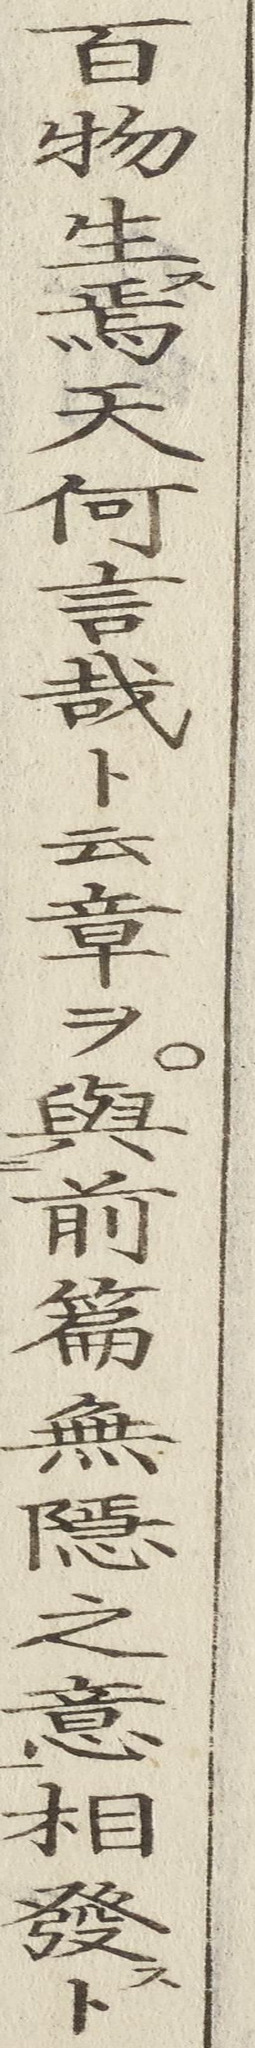百物生焉天何言哉ト云章ヲ。与前篇無隠之意相発
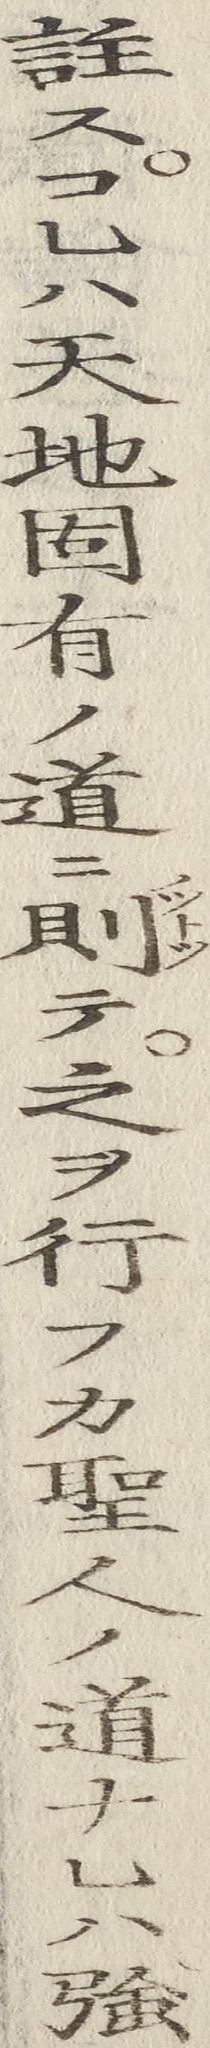註ス。コレハ天地固有ノ道ニ則テ。之ヲ行フカ聖人ノ道ナレハ強
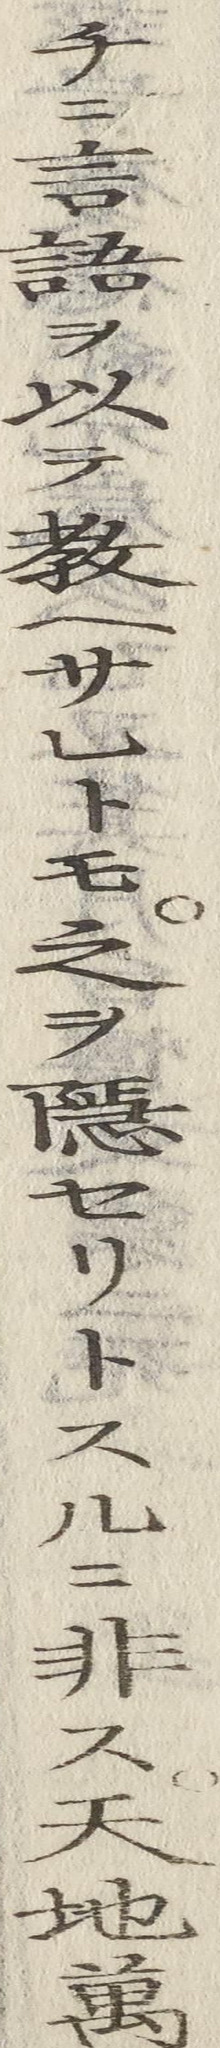チニ言語ヲ以テ教ヘサレトモ。之ヲ隠セリカラトスルニハ非ス。天地万
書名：護法新論　上
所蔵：東京大学地震研究所図書室 Earthquake Research Institute Library, The University of Tokyo, JAPAN
